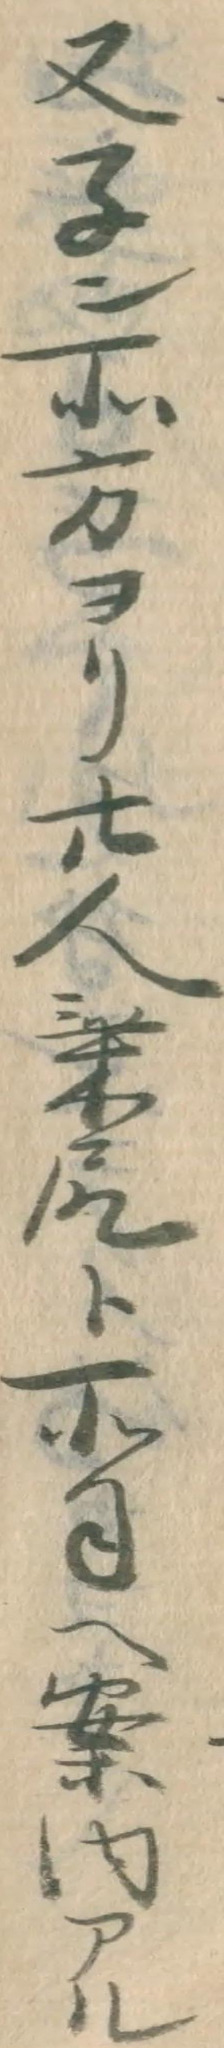又子ン所方ヨリ廿人乗尻ト所司ヘ案内アル

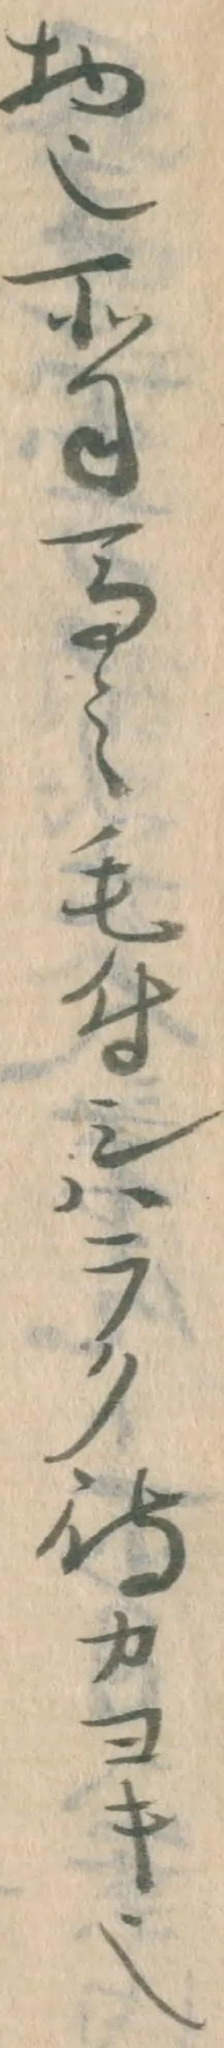物也所司馬之毛付シハラク待カヨキ也
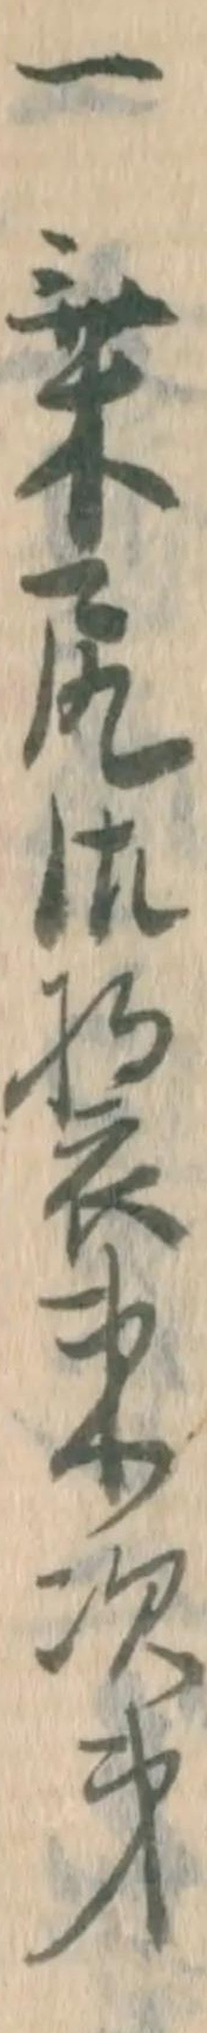一乗尻御装束次第
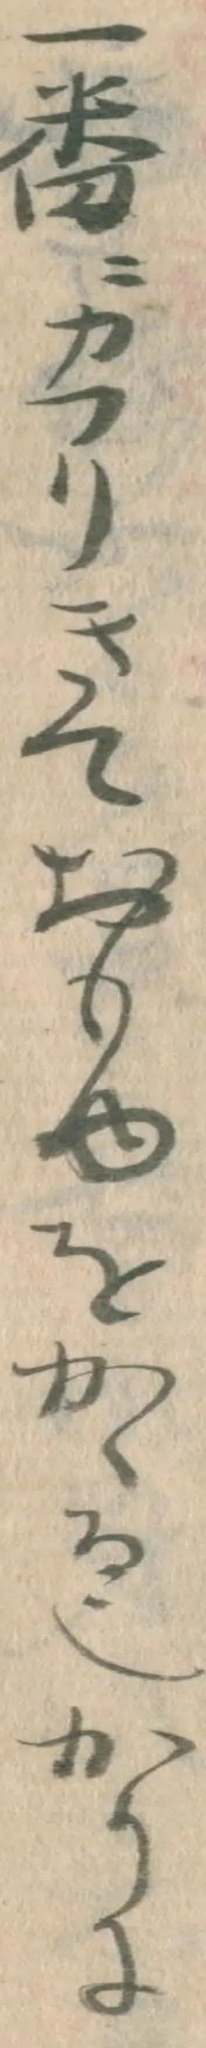一番ニカフリきておもゆをかゝる也かりに
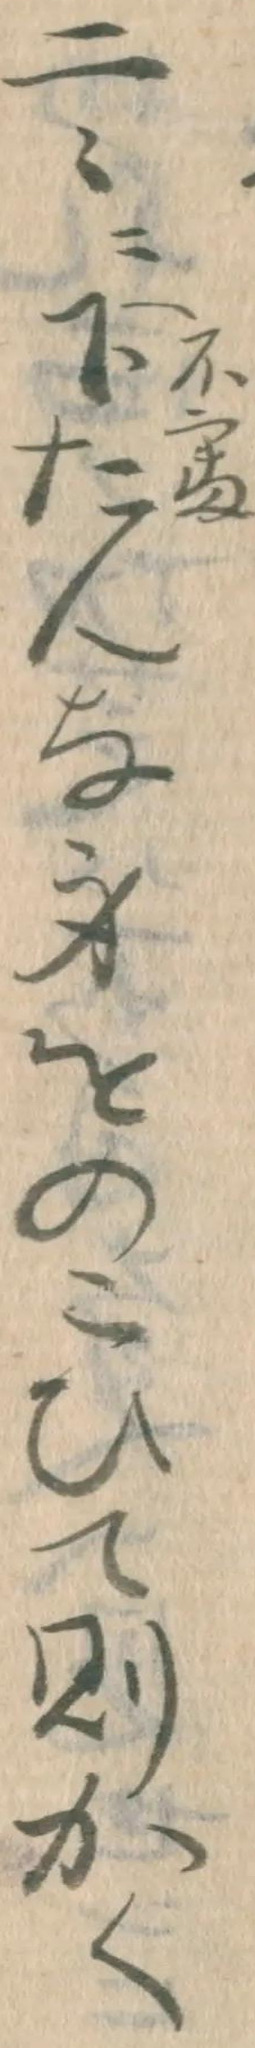二々ニ下たんな身をのこひて則かく
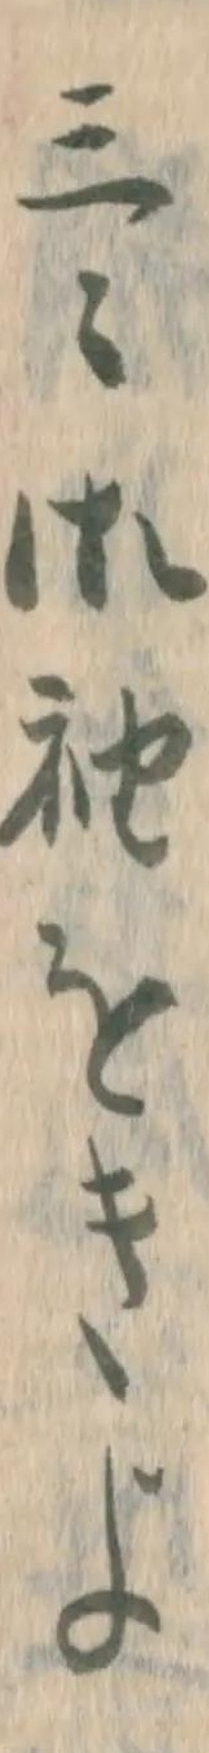三々御袖をきよ
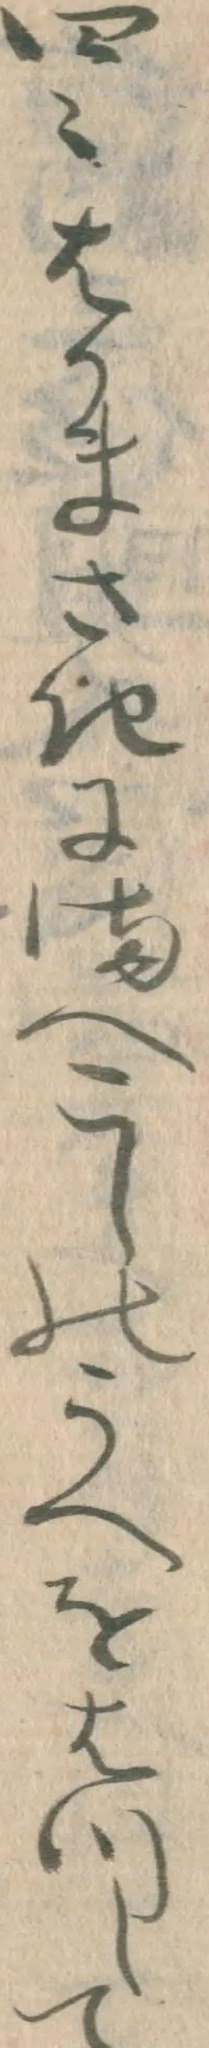四々はかまさきにまへこしのうへをはつして
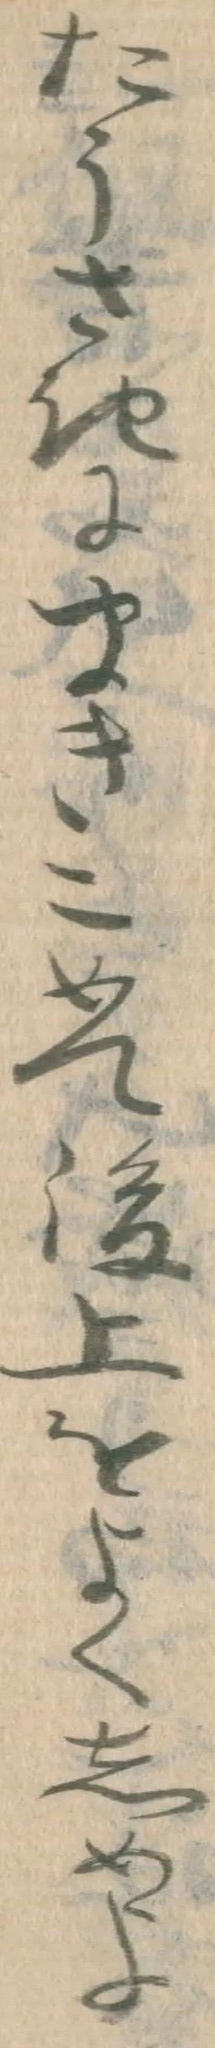たうさきにまきこめて後上をよくしめよ
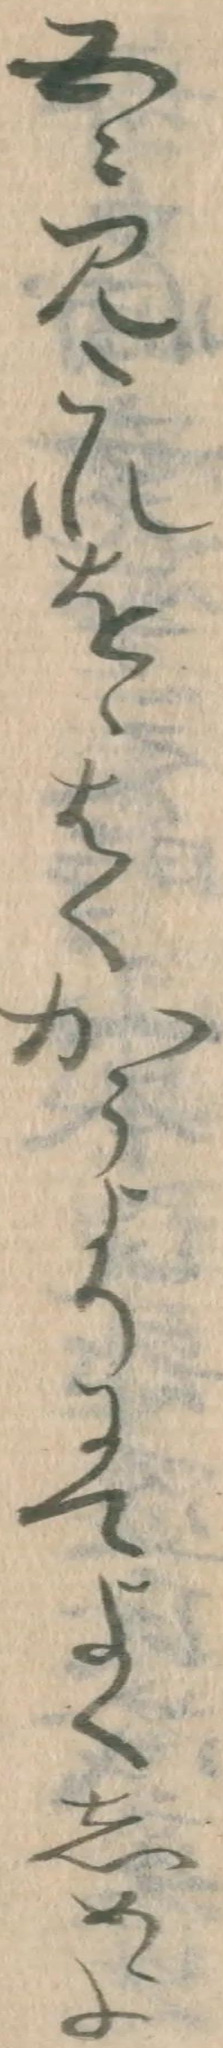五々みたれをゝはくかうよりにてよくしめよ
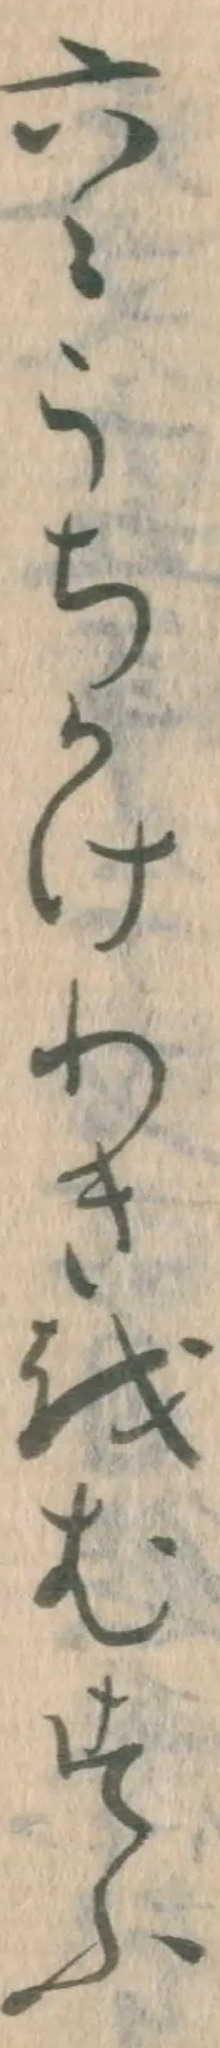六々うちかけわきをむすふ
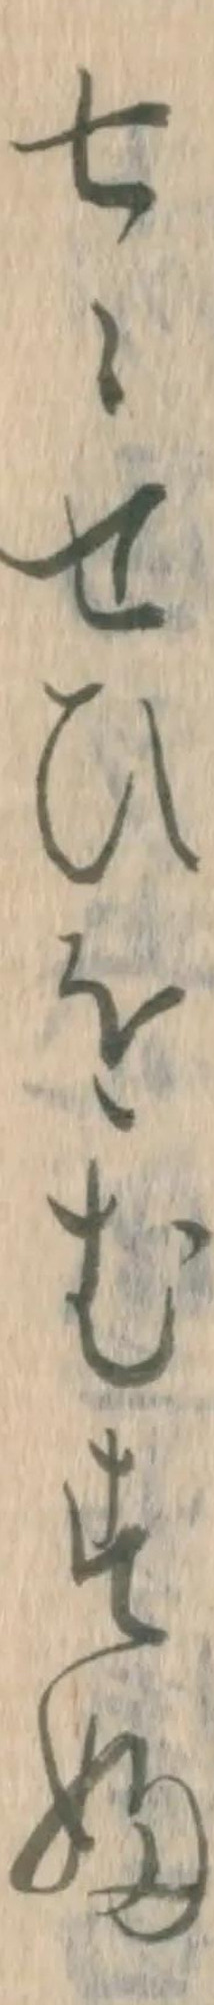七々せひをむすふ
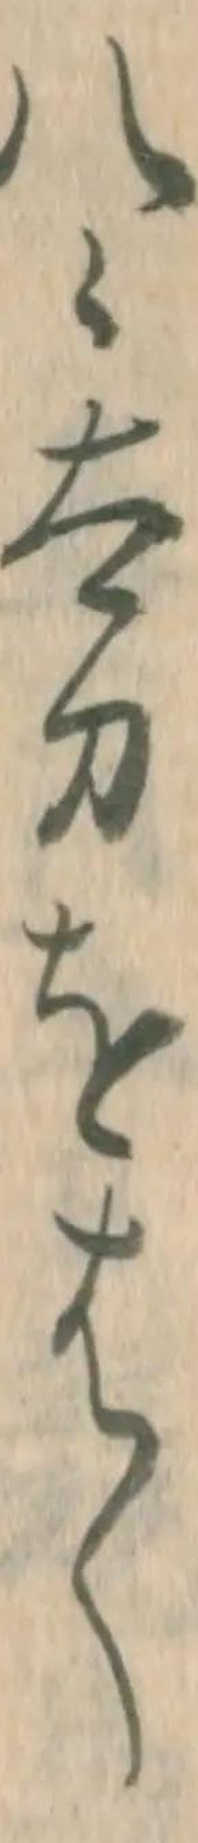八々太刀をはく
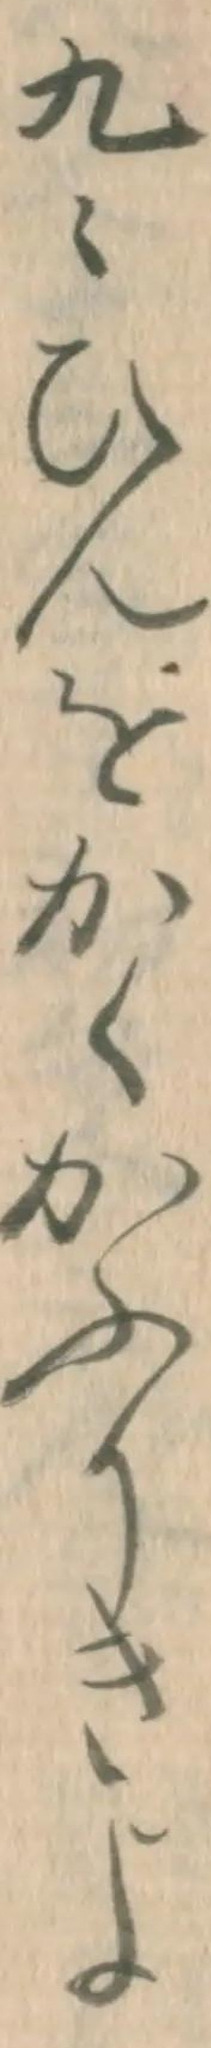九々ひんをかくかふりきよ
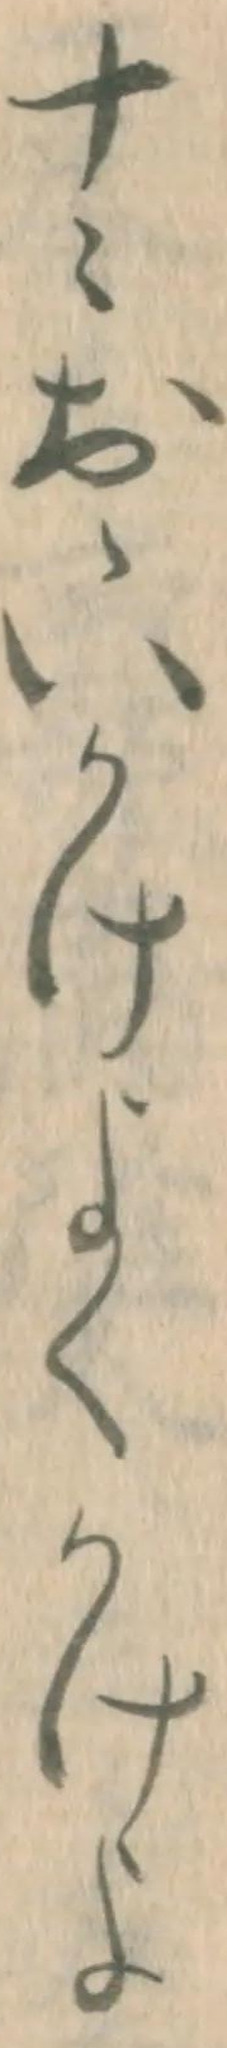十々おゝいかけよくかけよ
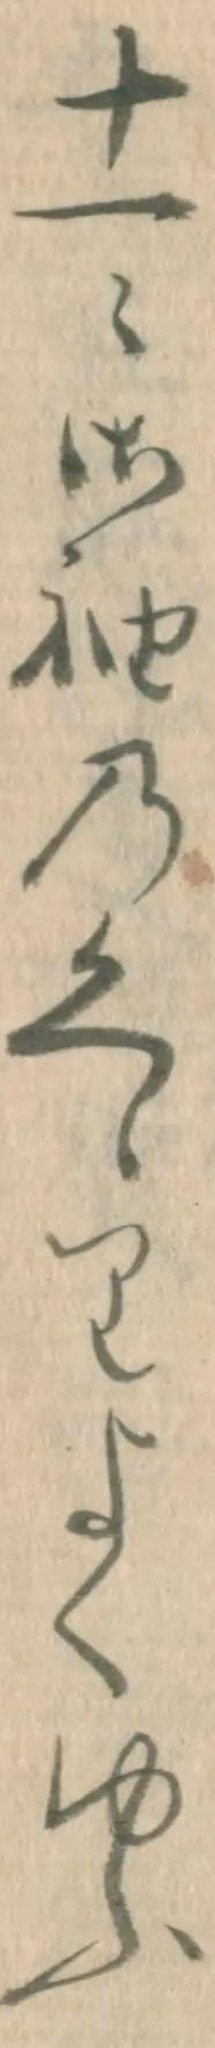十一々御袖のくゝりよくゆふ
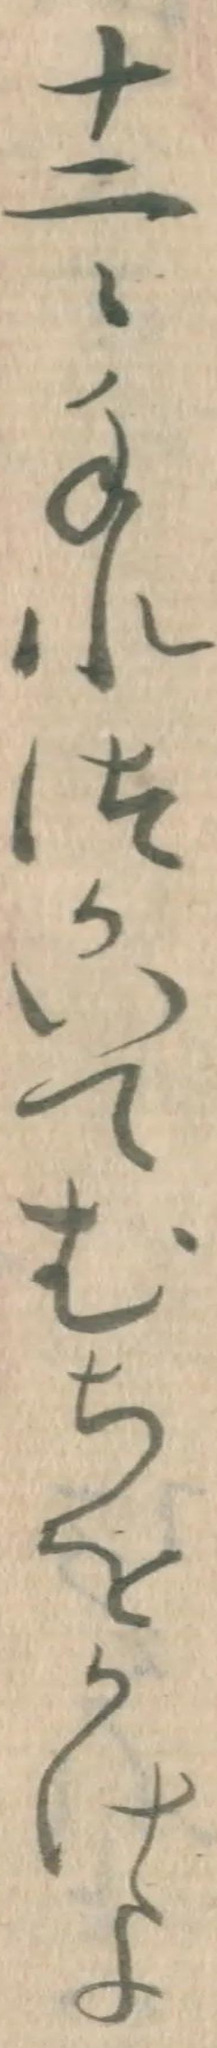十二々手水つかいてむちをかけよ
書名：賀茂社記録. 第10冊
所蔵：国立国会図書館 National Diet Library, JAPAN
